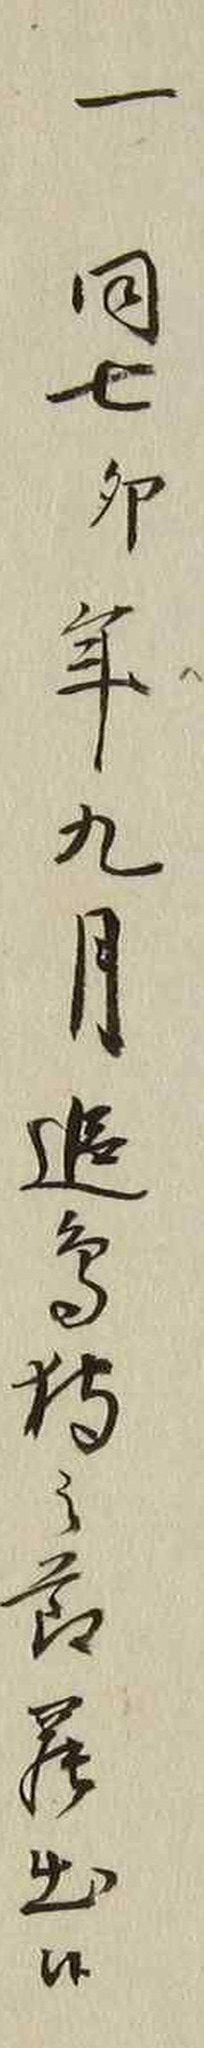一同七卯年九月追鳥狩之節罷り出で候
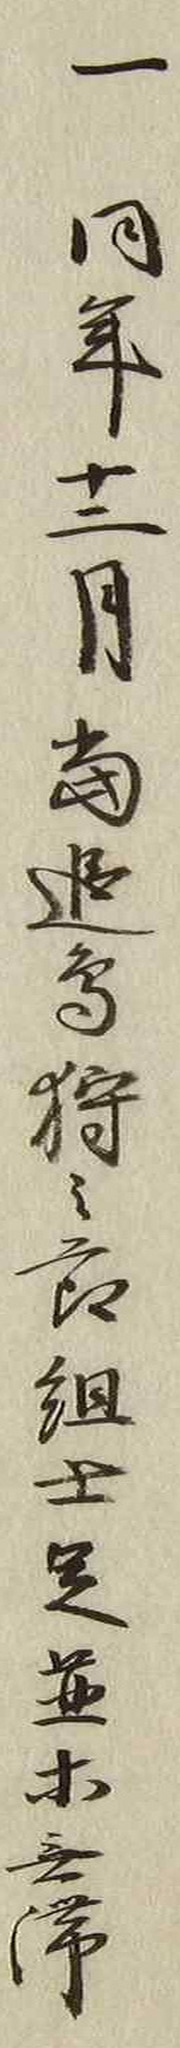一同年十二月当追鳥狩之節組士足並等滞り無く
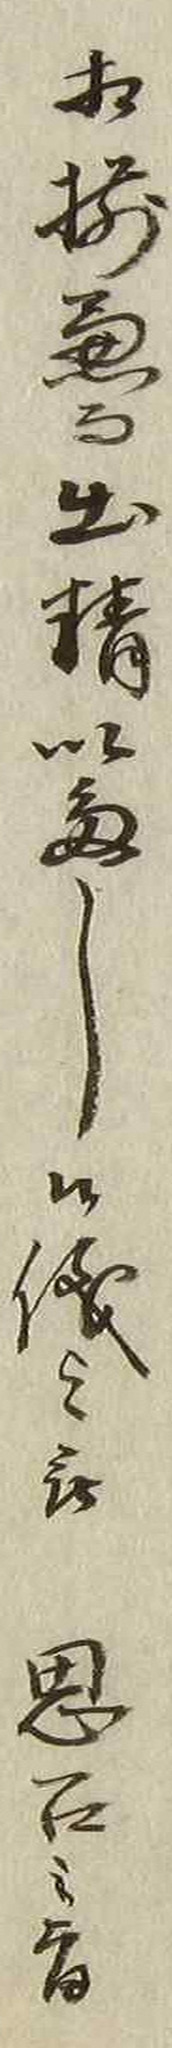相揃い兼ねて出精いたし候儀と思召され候旨
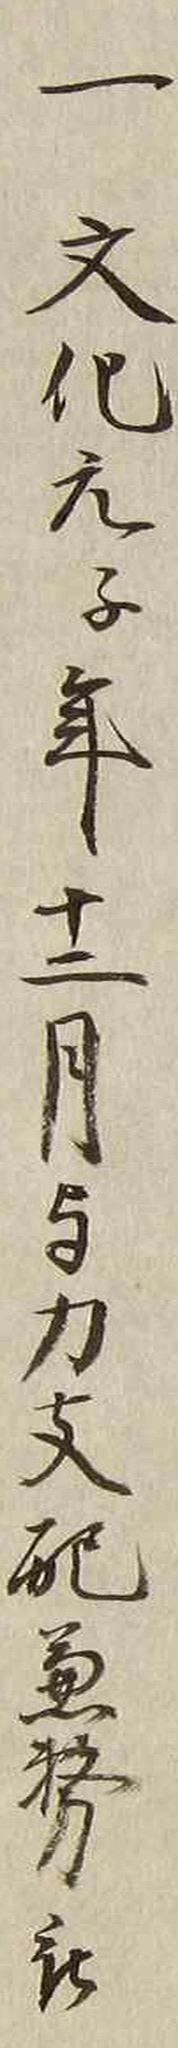一文化元子年十二月与力支配兼務
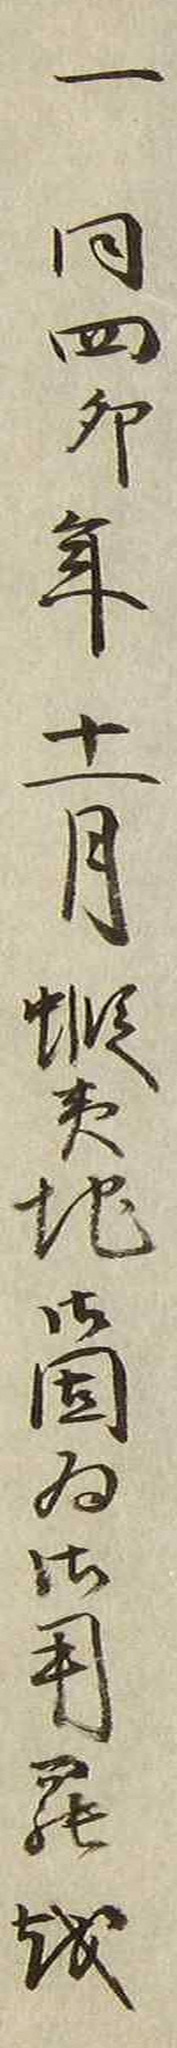一同四卯年十一月蝦夷地御固め御用之為罷り越

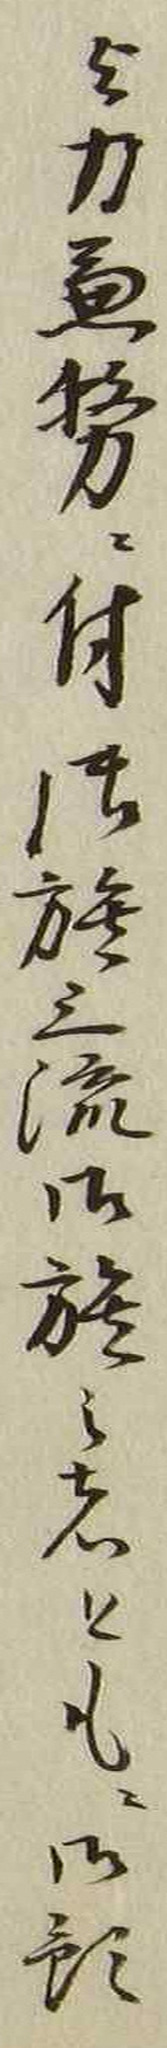与力兼務ニ付き御旗三流御旗之者ともニ御預り
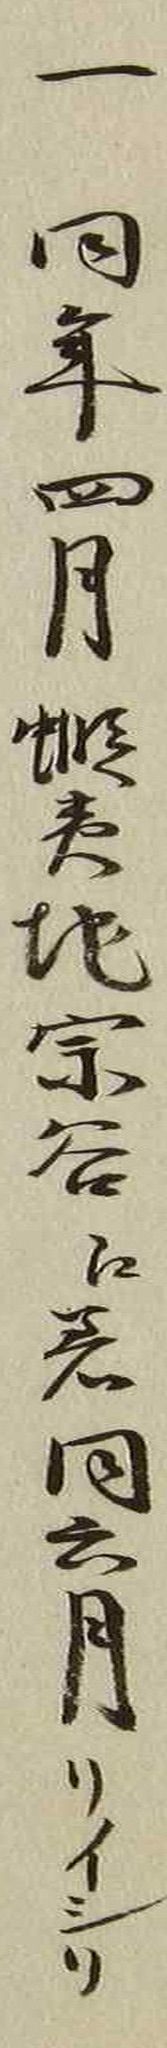一同年四月蝦夷地宗谷へ着同六月リシイリ
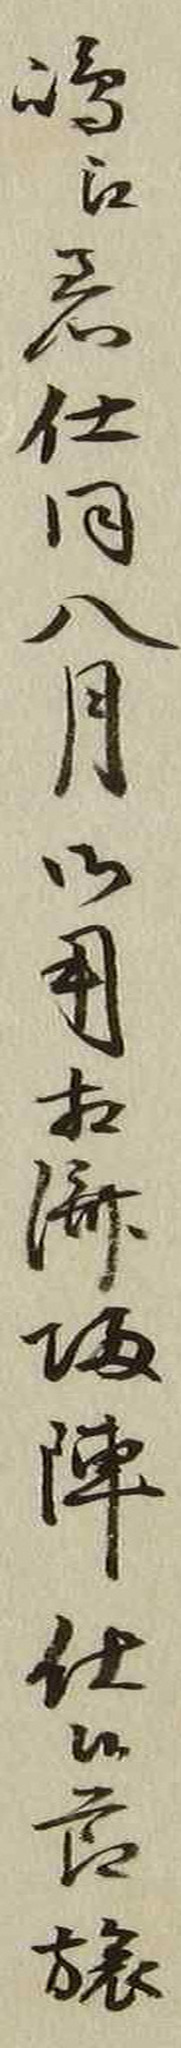嶋へ着仕り同八月御用相済み帰陣仕り候節旅
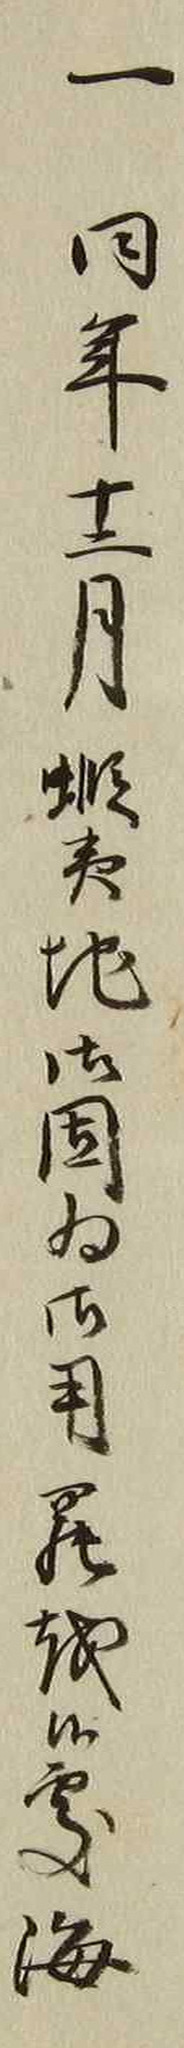一同年十二月蝦夷地御固め御用之為罷り越候処海
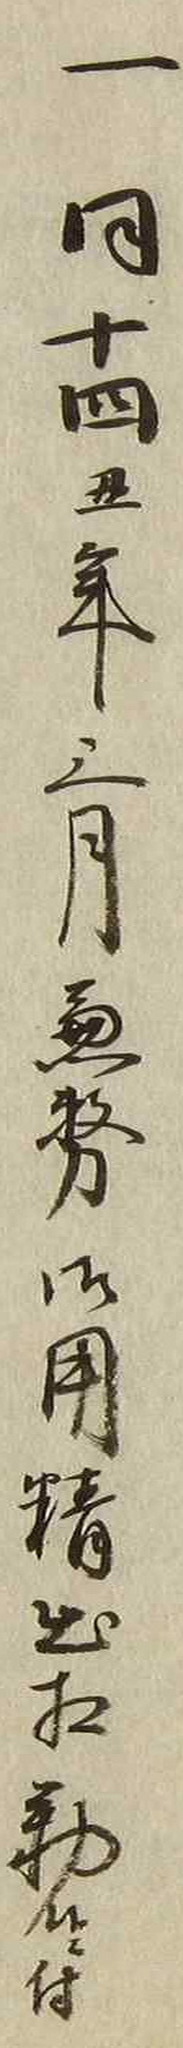一同十四丑年三月兼務御用精出し相勤め候ニ付き
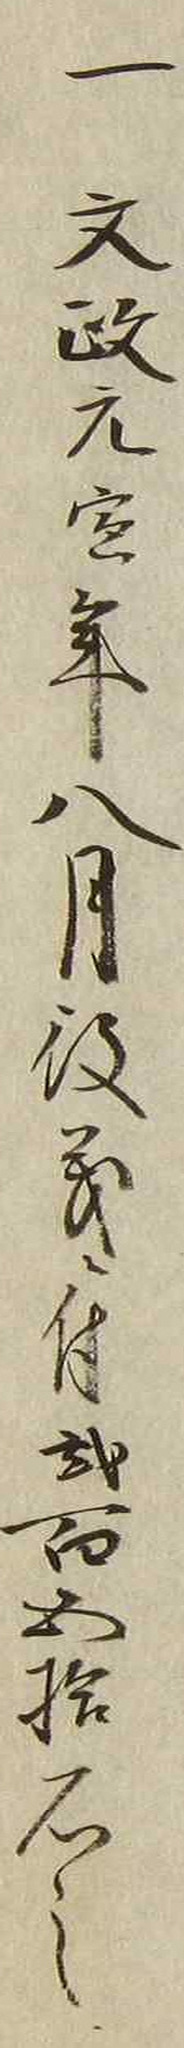一文政元寅年八月役義ニ付き弐百五拾石之

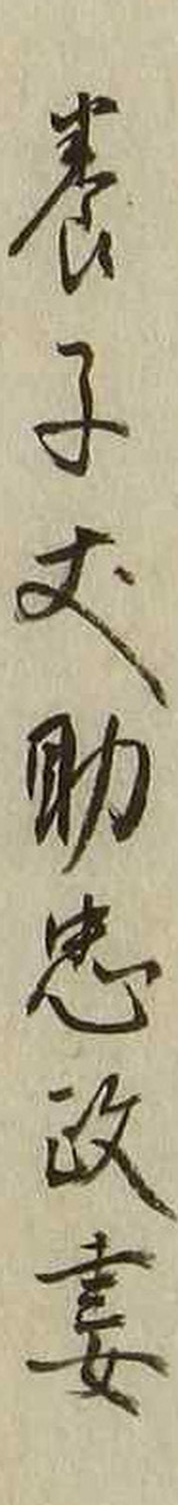女養子丈助忠政妻
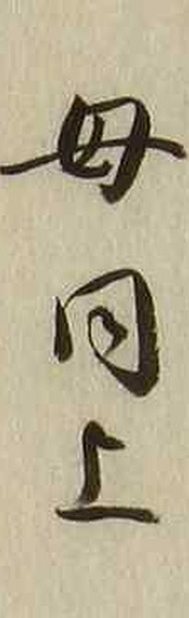母同上
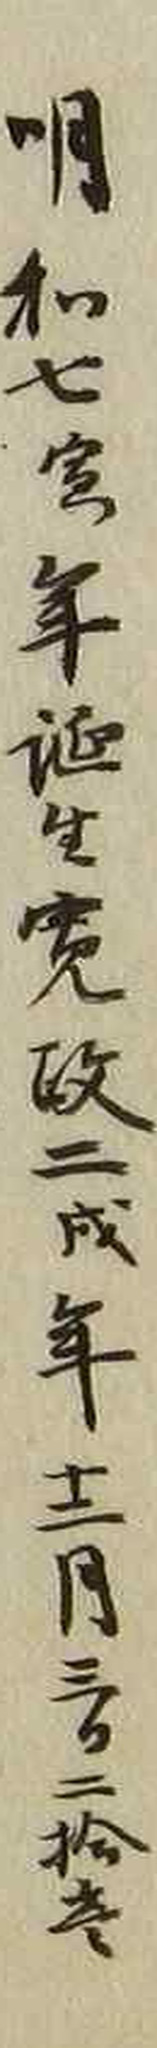明和七寅年誕生寛政二戌年十二月三日二拾壱
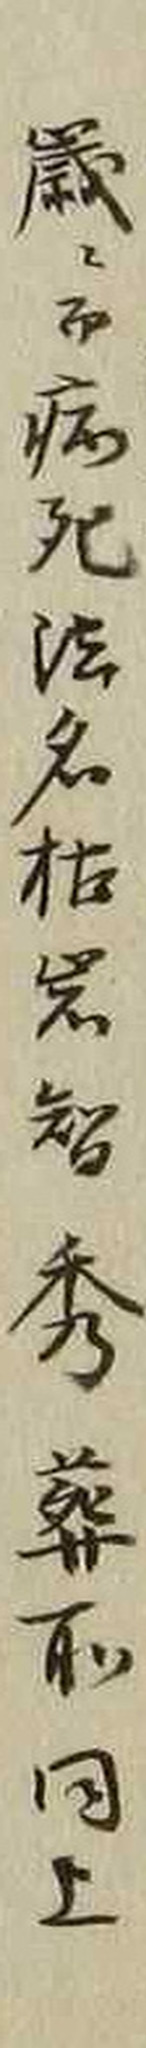女歳ニて病死法名枯岩智秀葬所同上
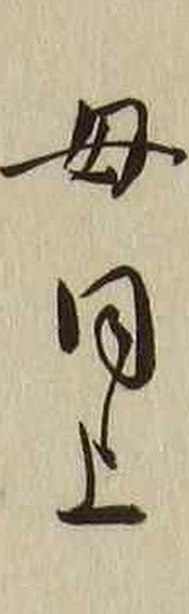母同上
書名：諸士系譜　巻之19　い之部19
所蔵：会津若松市立会津図書館
